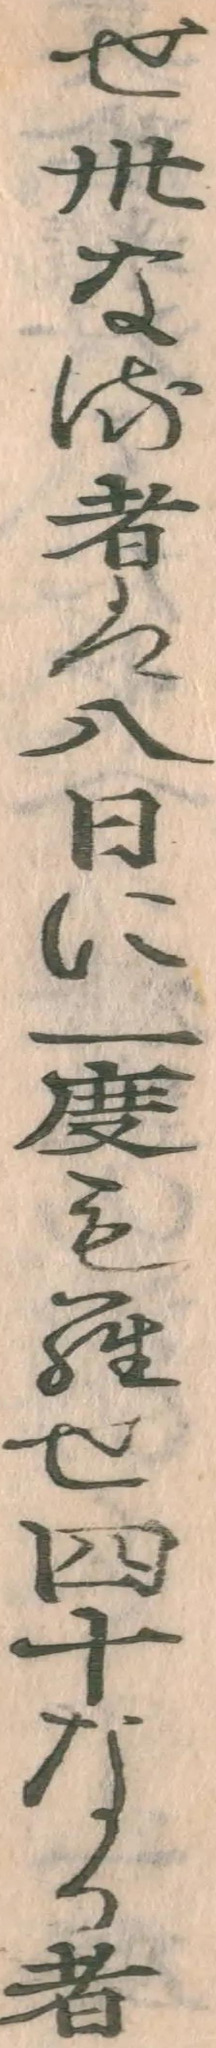せ卅なる者は八日に一度もらせ四十なる者
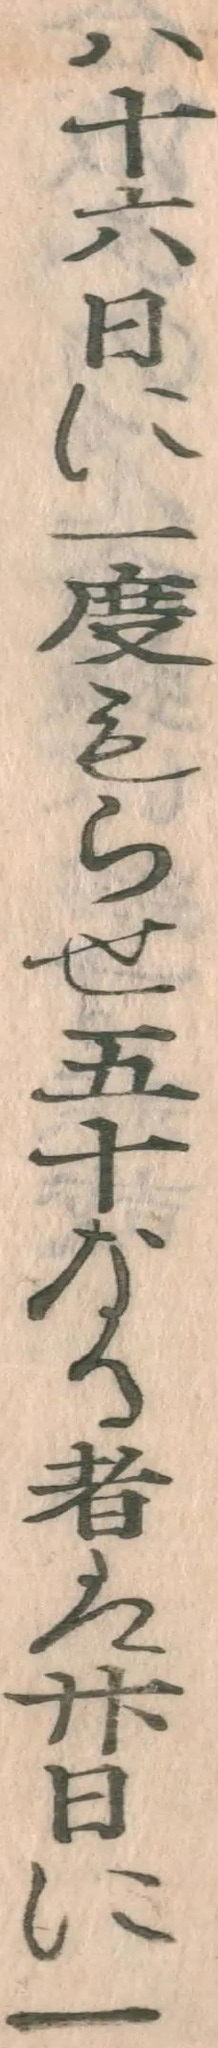は十六日に一度もらせ五十なる者は廿日に一
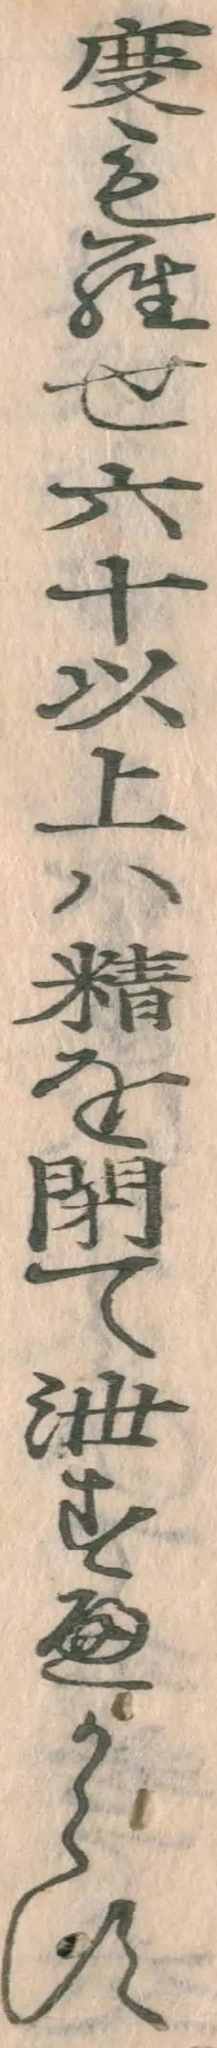度もらせ六十以上は精を閉て泄すへからす
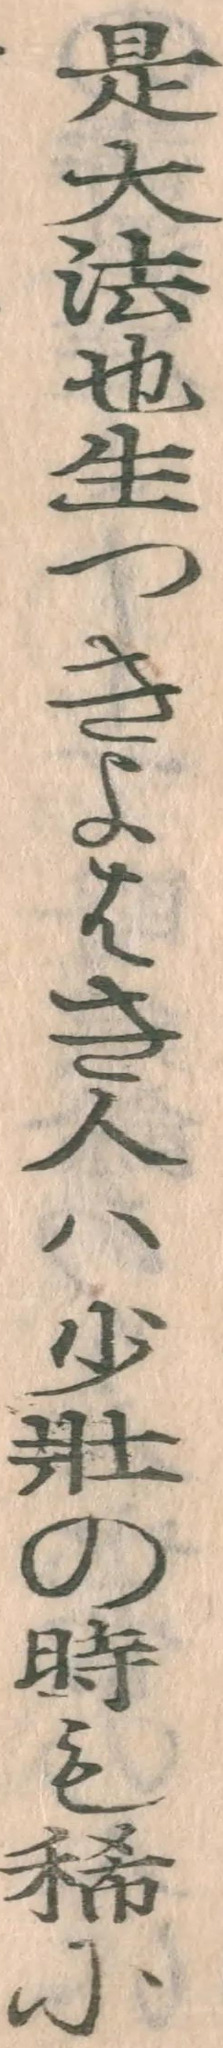是大法也生つきよはき人は少壮の時も稀に
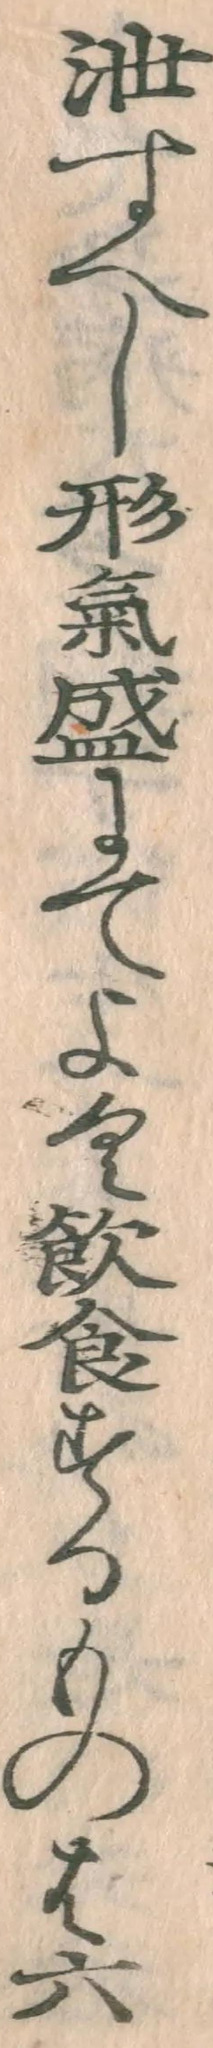泄すへし形気盛にてよく飲食するものは六
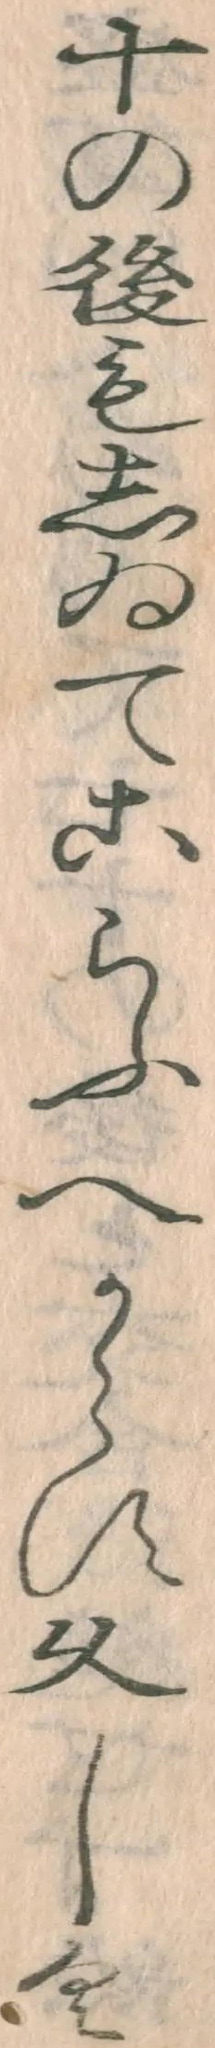十の後もしゐてこらふへからす久しく
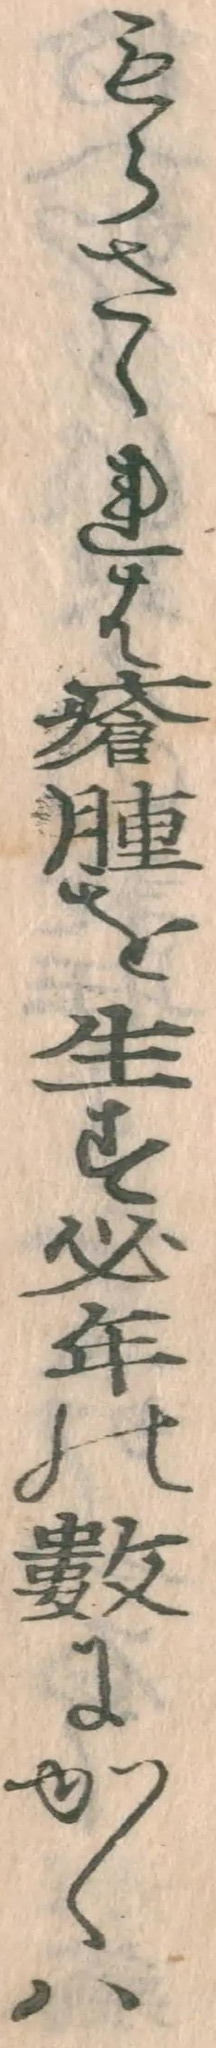もらさゝれは瘡腫を生す必年の数にかゝは

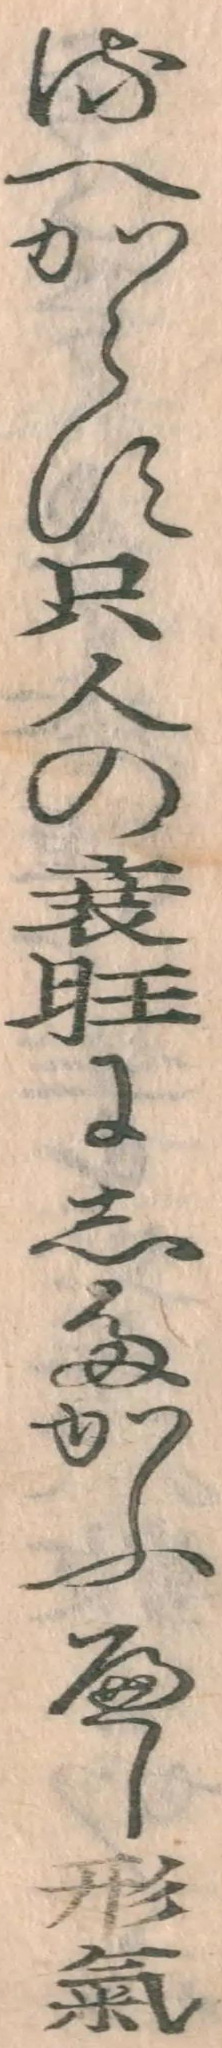るへからす只人の衰旺にしたかふへし形気
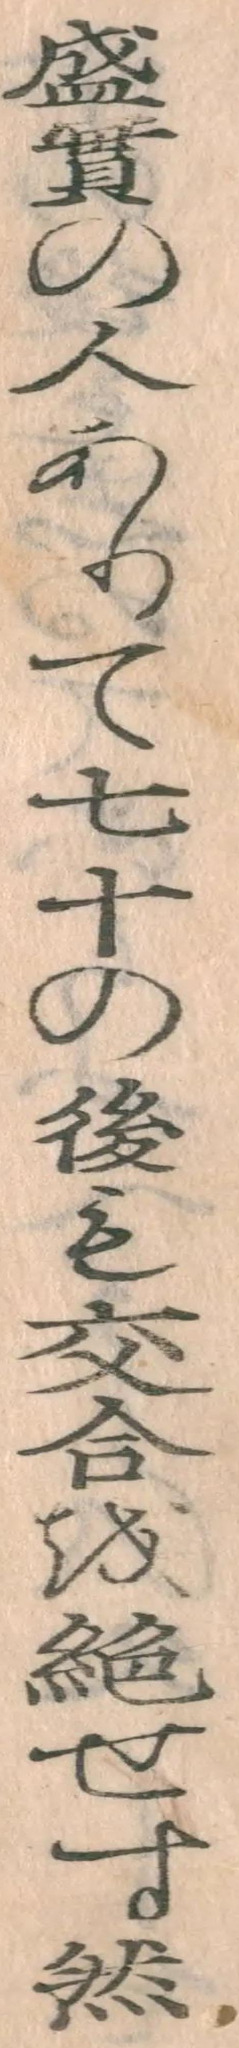盛実の人ありて七十の後も交合を絶せす然
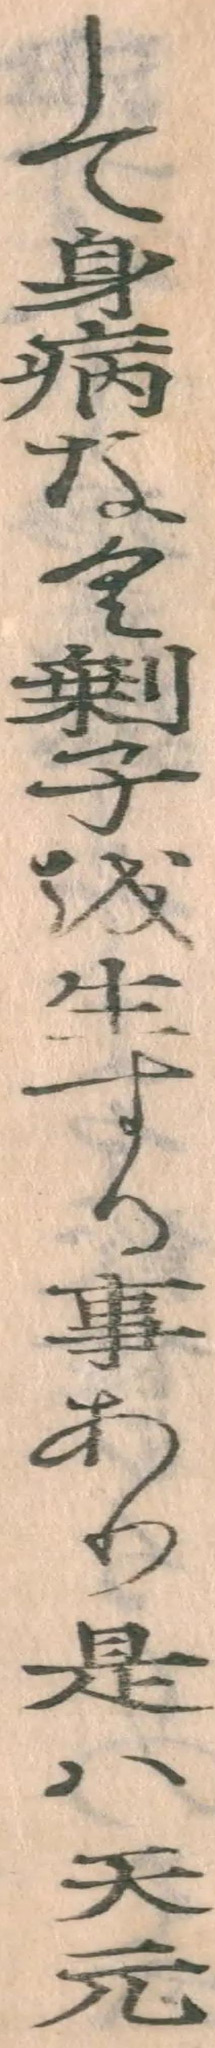して身病なく剰子を生する事あり是は天元
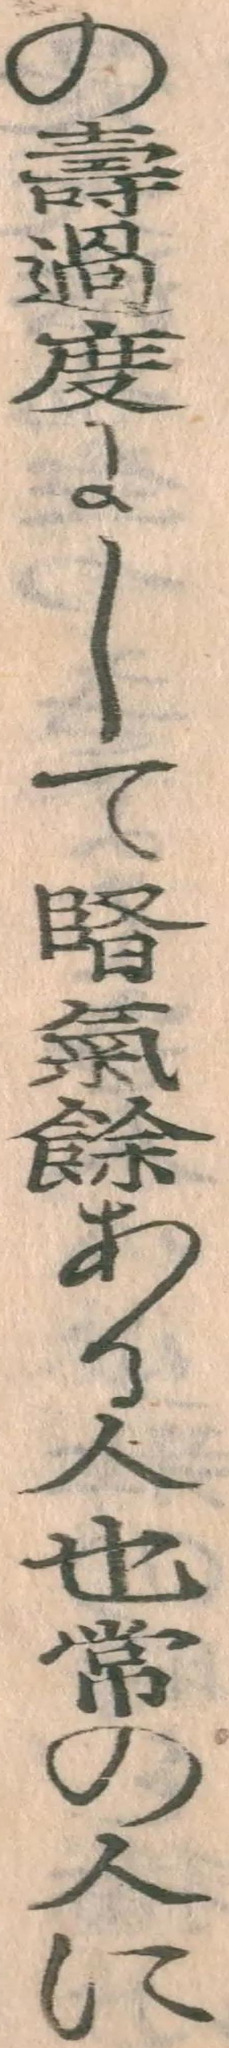の寿過度にして腎気余ある人也常の人に
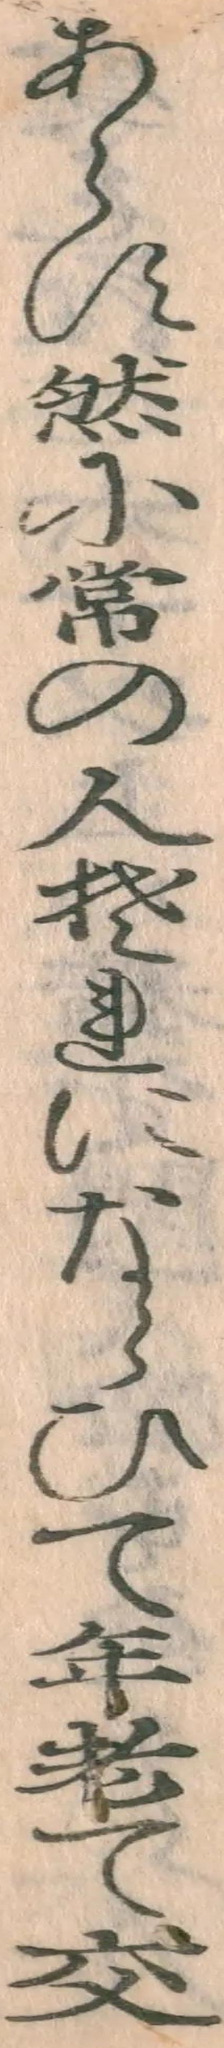あらす然に常の人それにならひて年老て交
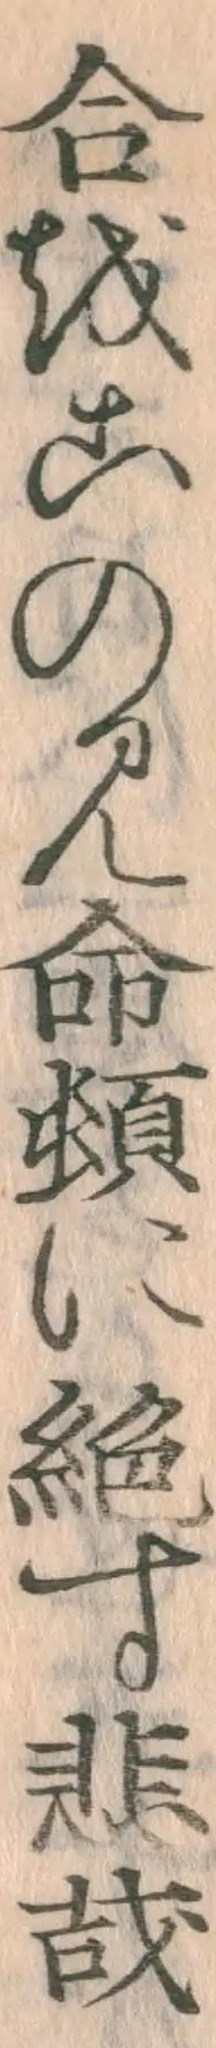合をこのみ命頓に絶す悲哉
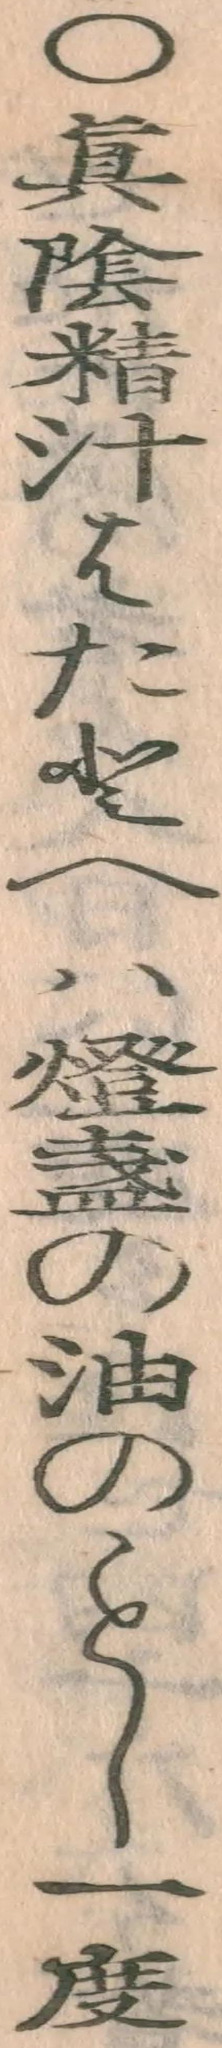〇真陰精汁はたとへは灯盞の油のことし一度
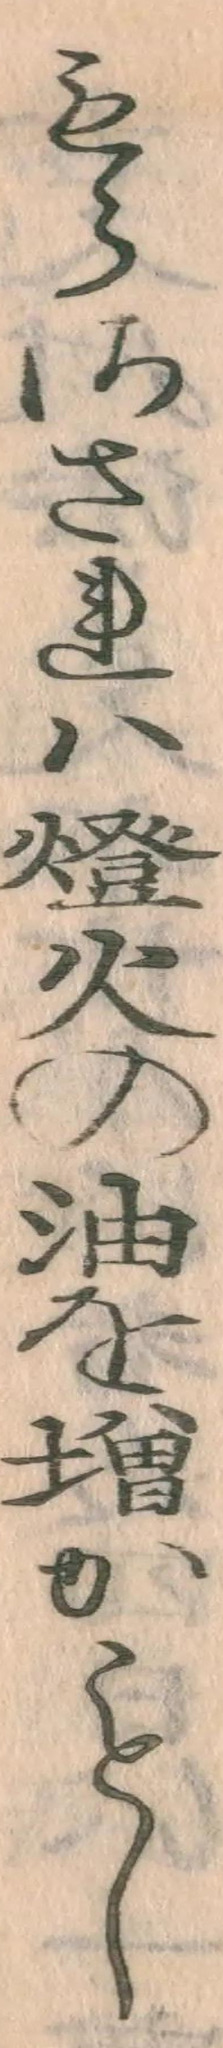もらさされは灯火の油を増かことし
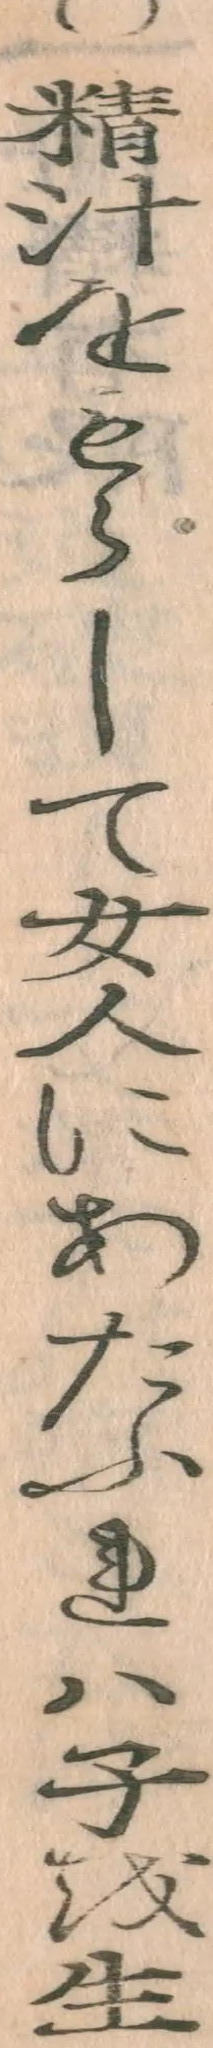〇精汁をもらして女人にあたふれは子を生
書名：延壽撮要
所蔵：国立国会図書館 National Diet Library, JAPAN
